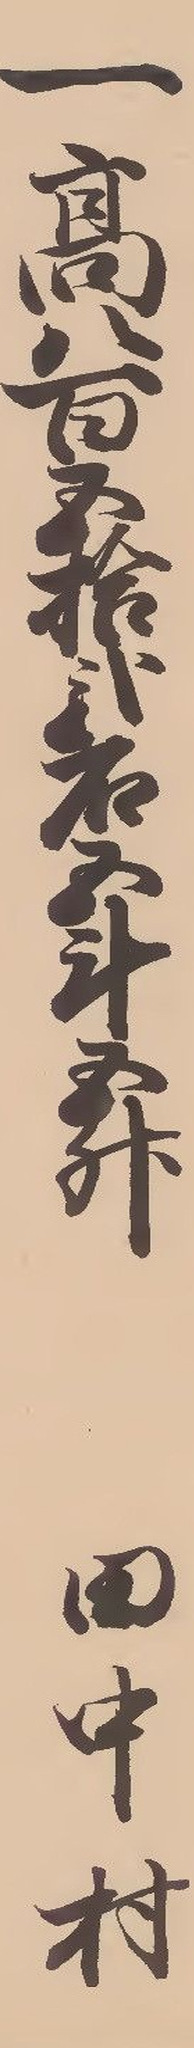一高八百五拾弐石五斗五升田中村
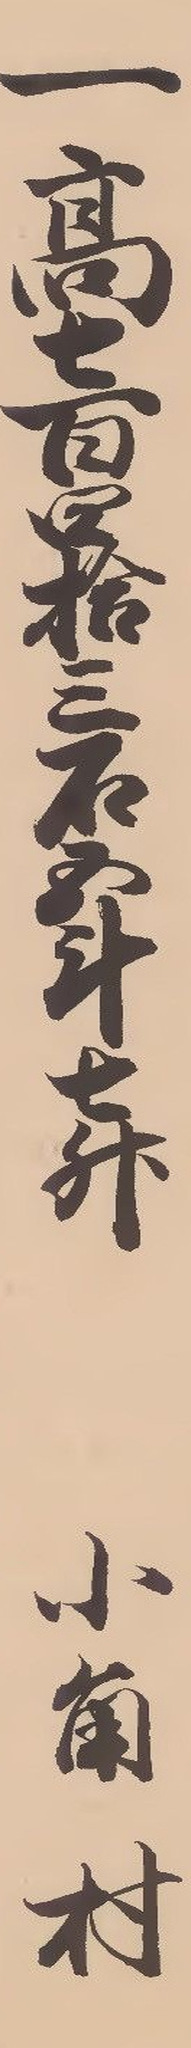一高七百四拾三石五斗七升小角村
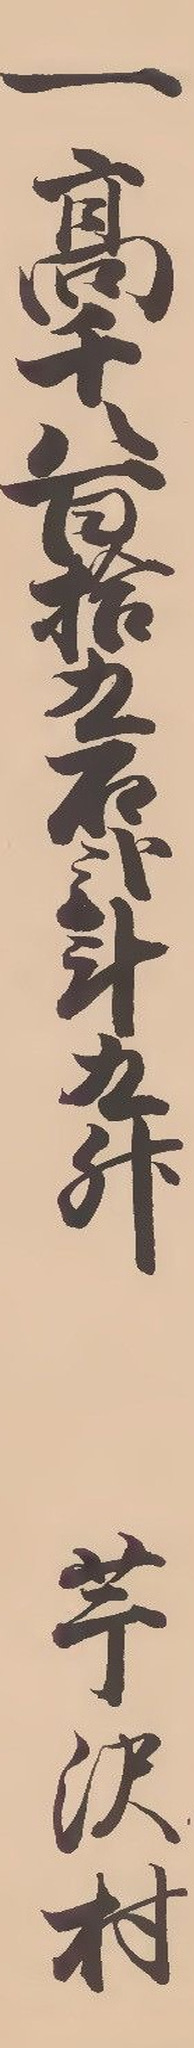一高千八百拾九石弐斗九升芋沢村
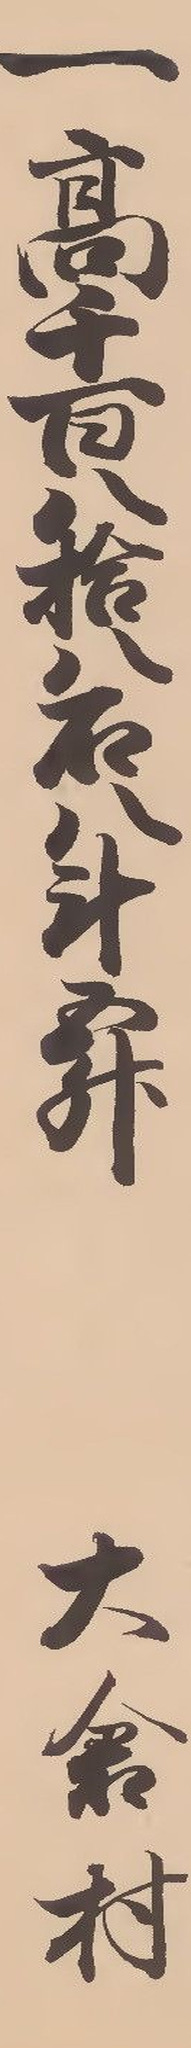一高千百八拾八石八斗五升大倉村
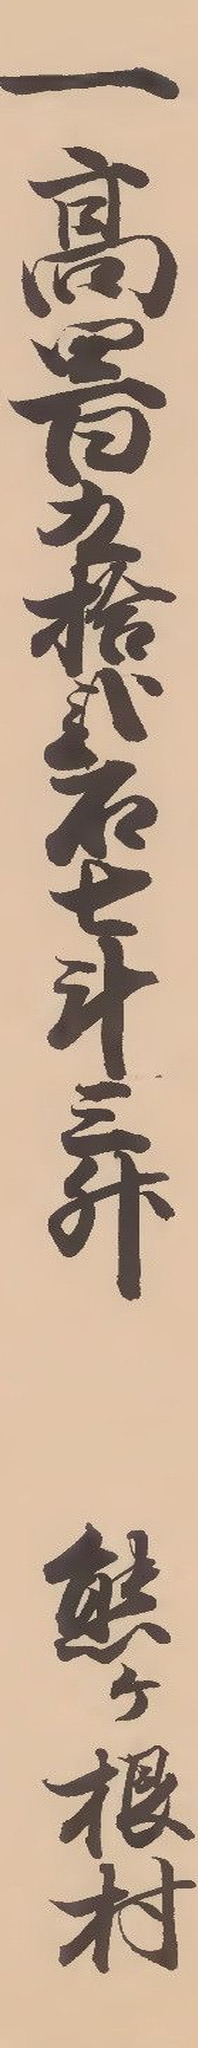一高四百九拾弐石七斗三升熊ヶ根村
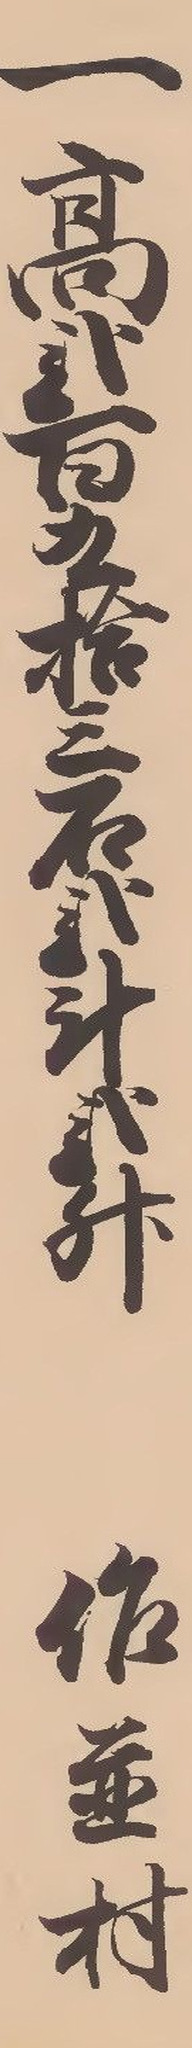一高弐百九拾三石弐斗弐升作並村
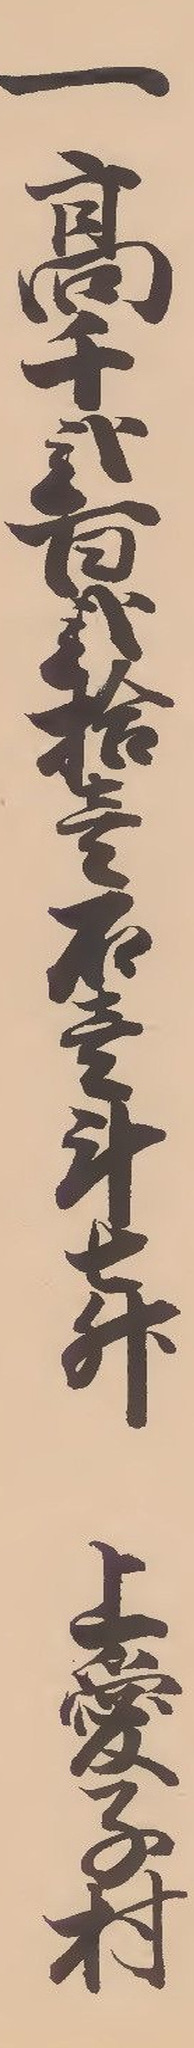一高千弐百弐拾壱石壱斗七升上愛子村

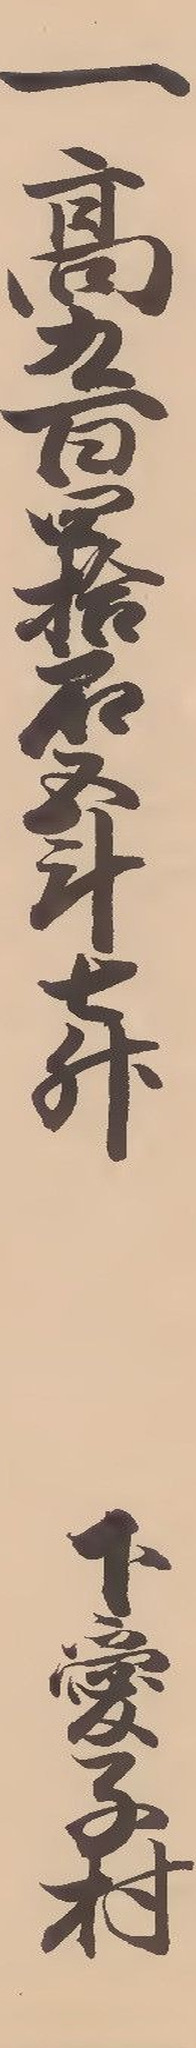一高九百四拾石五斗七升下愛子村
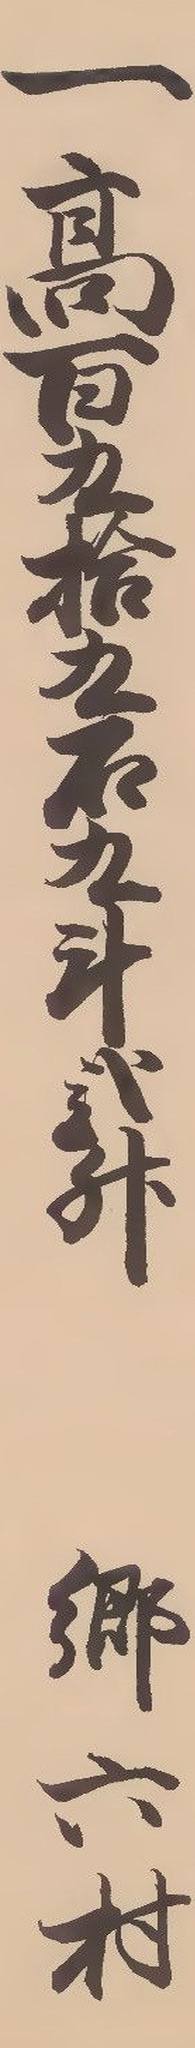一高百九拾九石九斗弐升郷六村
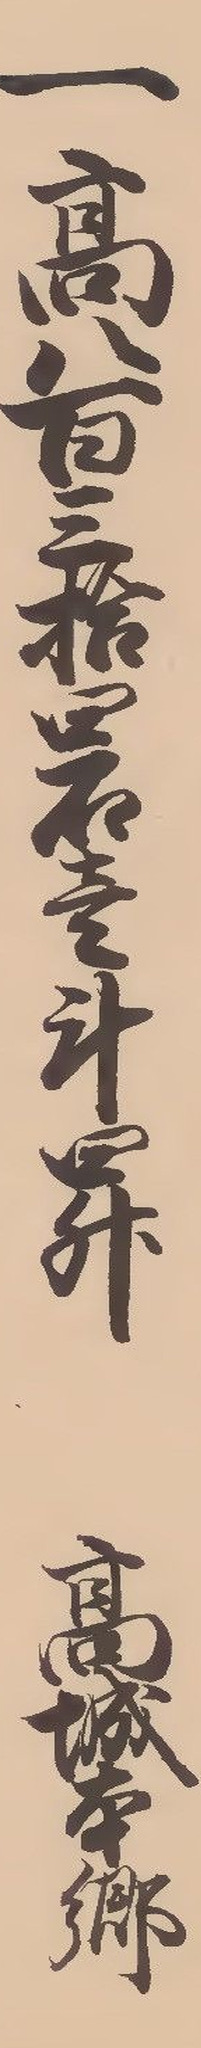一高八百三拾四石壱斗四升高城本郷
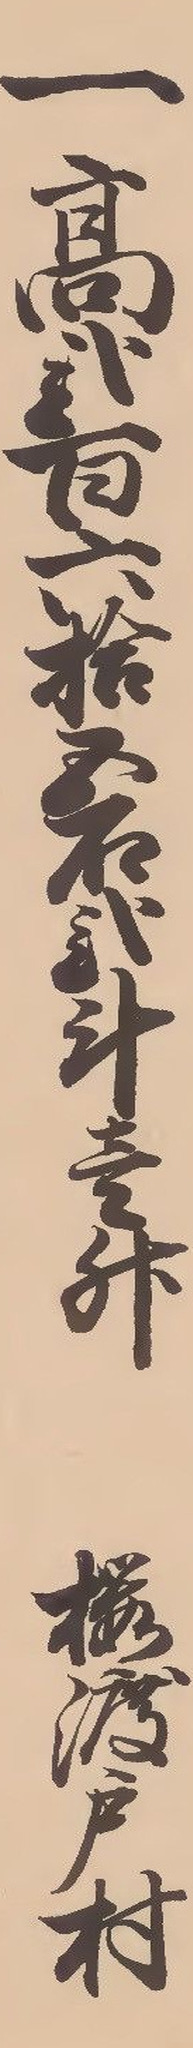一高弐百六拾五石弐斗壱升桜渡戸村
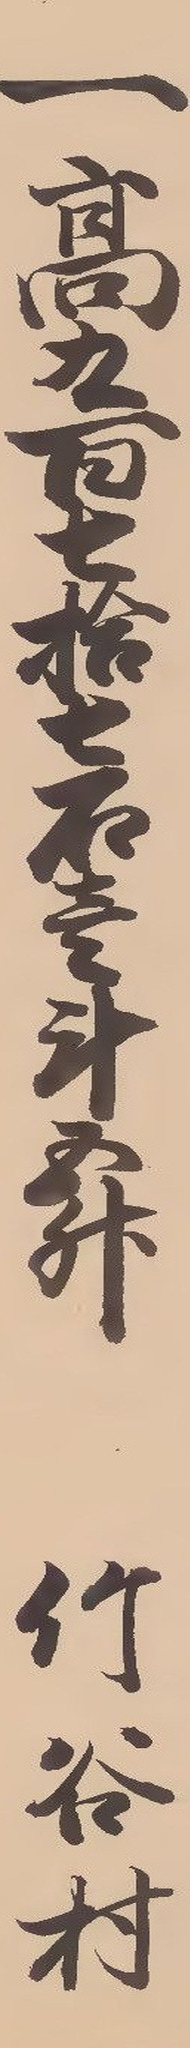一高九百七拾七石壱斗五升竹谷村
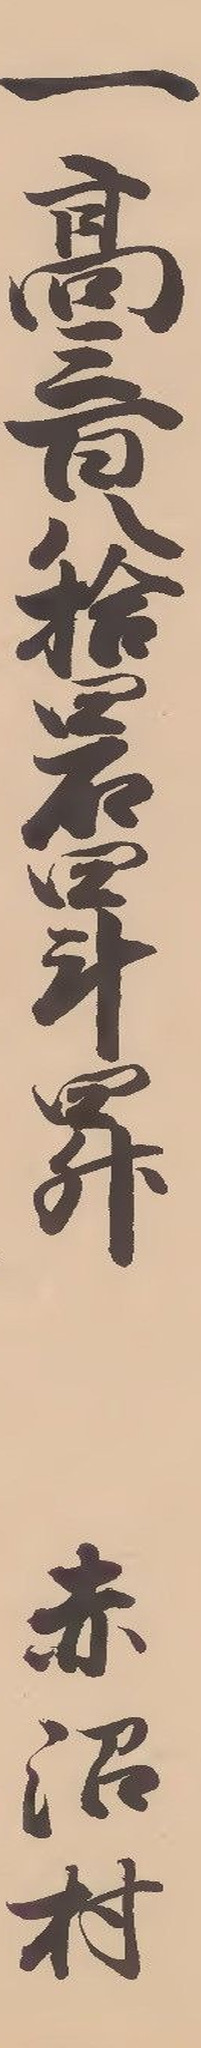一高三百八拾四石四斗四升赤沼村
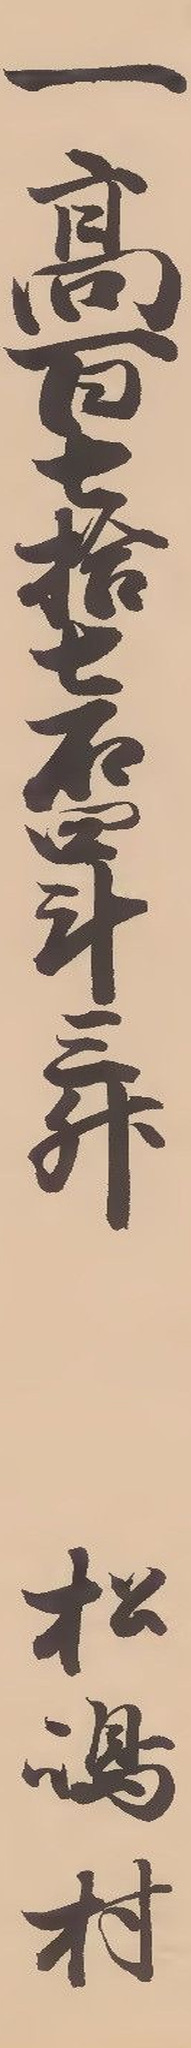一高百七拾七石四斗三升松島村
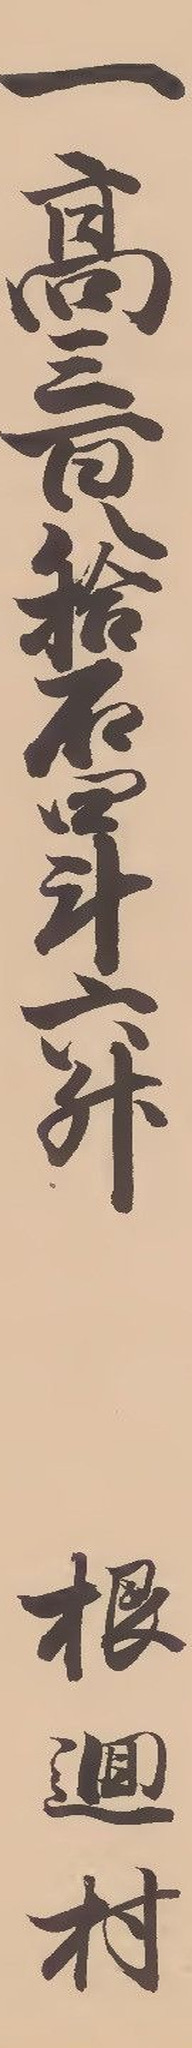一高三百八拾石四斗六升根廻村

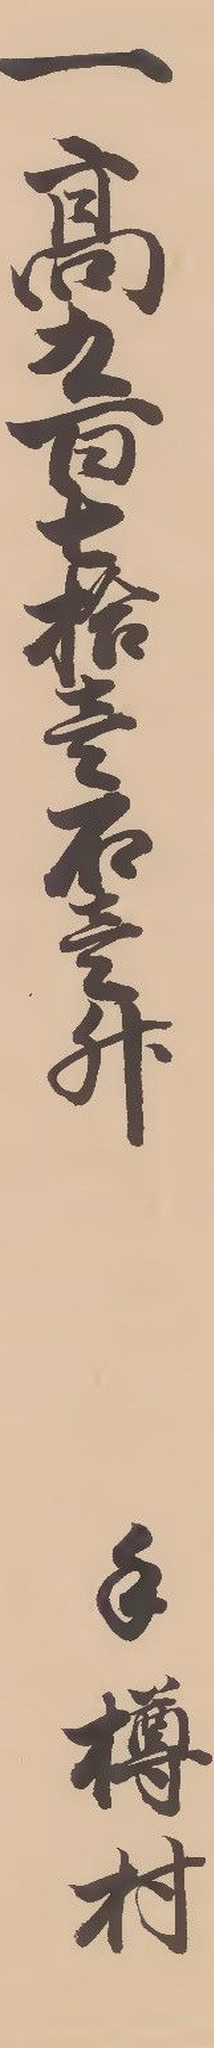一高九百七拾壱石壱升手樽村
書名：陸奥国郷帳　５
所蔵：国立公文書館 National Archives of Japan
